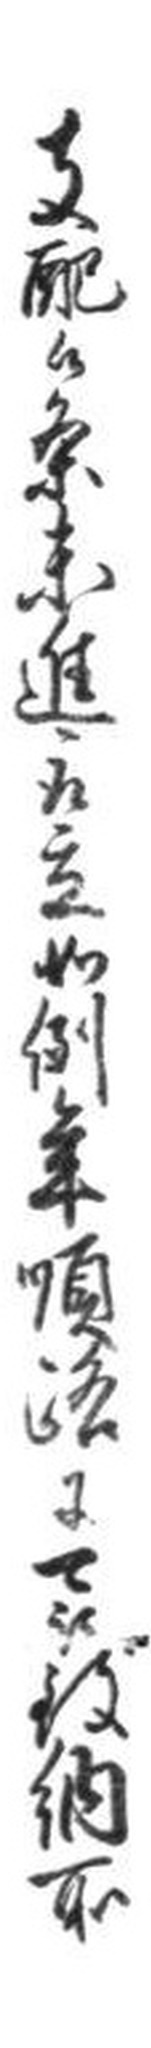支配候条未進取立如例年順路に可被致納所
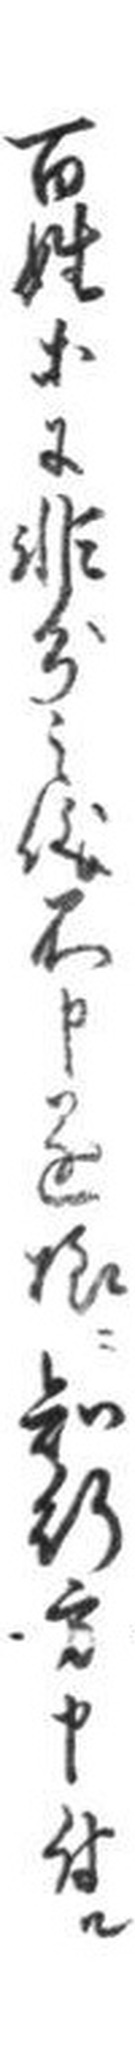百姓等に非分之儀不申懸様ニ知行方申付ル
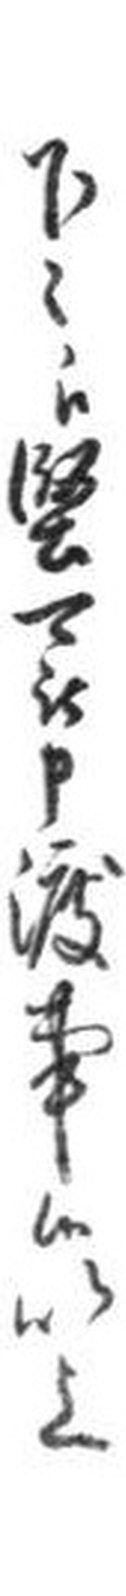下々江堅可被申渡事候以上
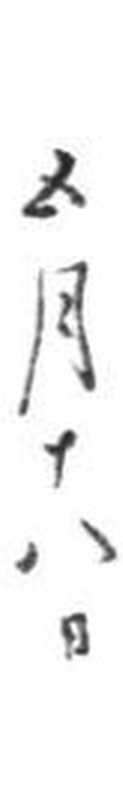五月十八日
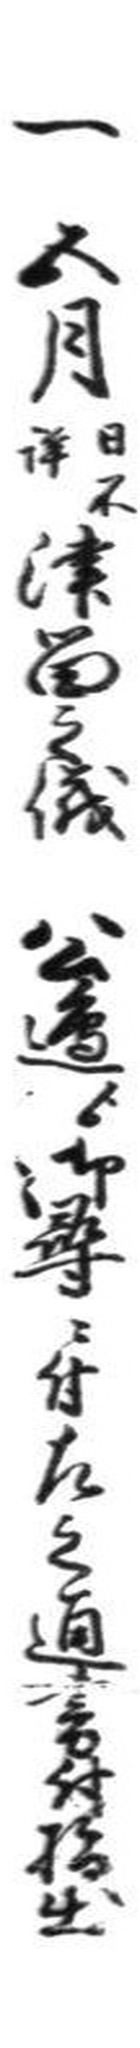一五月日不詳津留之儀公儀ゟ御尋ニ付左之通書付指出
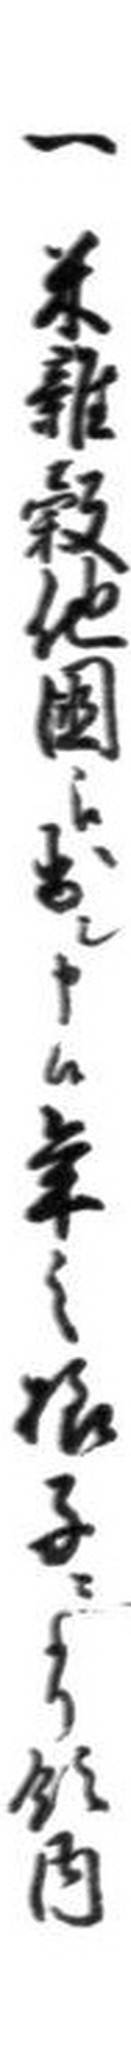一米雑穀他国江出シ申候年之様子ニより領内
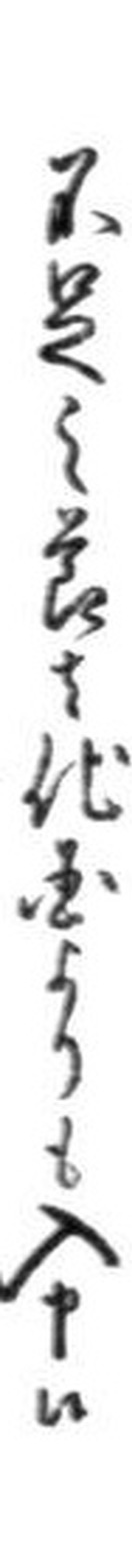不足之節者他国よりも入申候
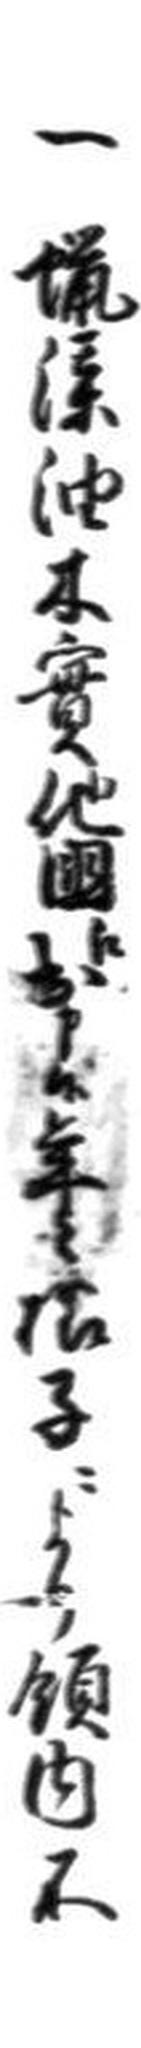一蝋漆油木実他国江出申候年之様子ニより領内不
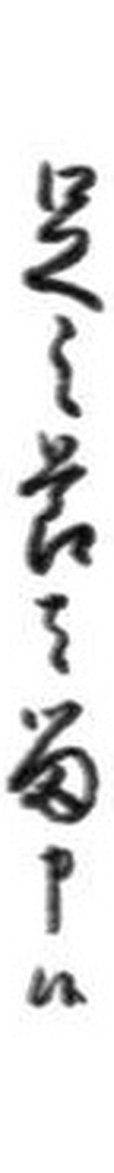足之節者留申候
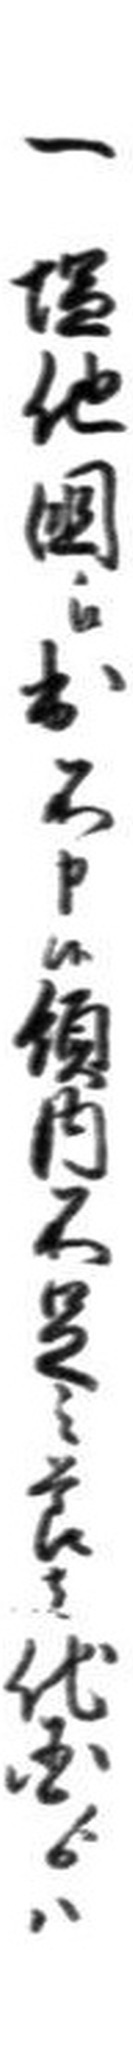一塩他国江出不申候領内不足之節者他国ゟハ
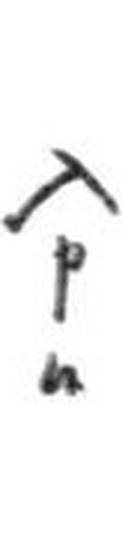入申候
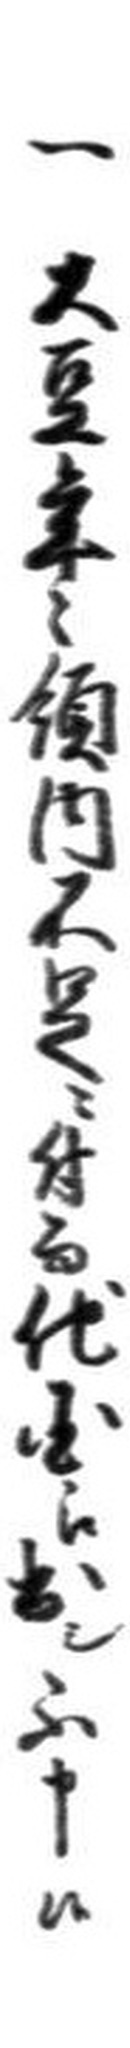一大豆年々領内不足ニ付而他国江出シ不申候
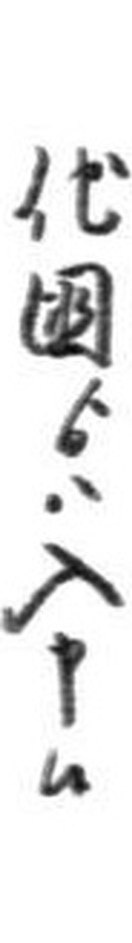他国ゟハ入申候
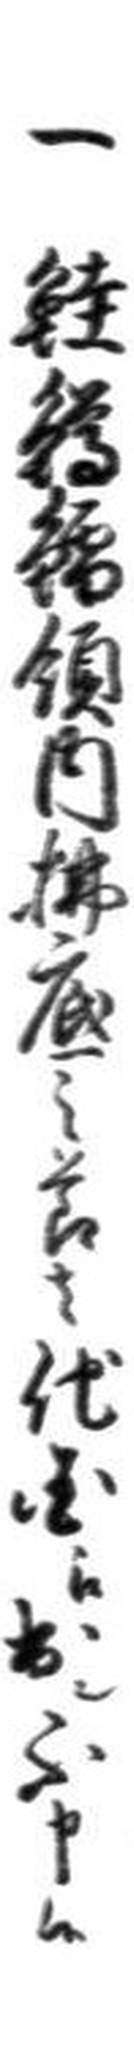一鮭鱒鱈領内払底之節者他国江出シ不申候

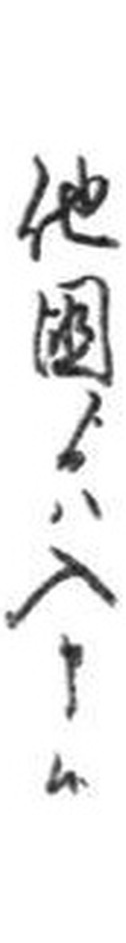他国ゟハ入申候
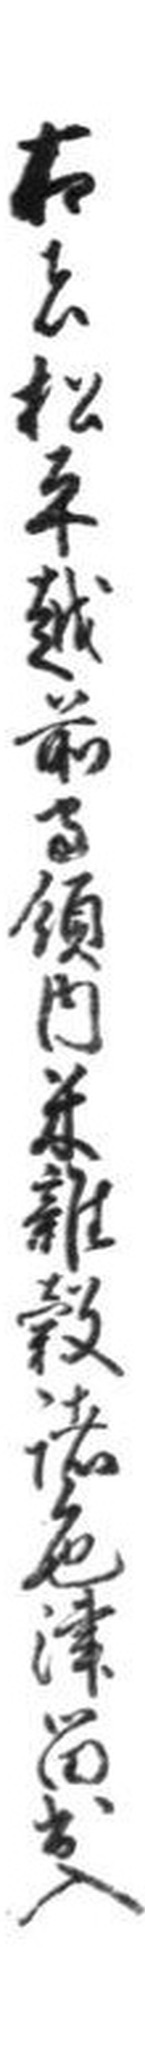右者松平越前守領内米雑穀諸色津留出入
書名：家譜 七 光通公 従寛文四年到同九年
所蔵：福井県文書館 Fukui Prefectural Archives
